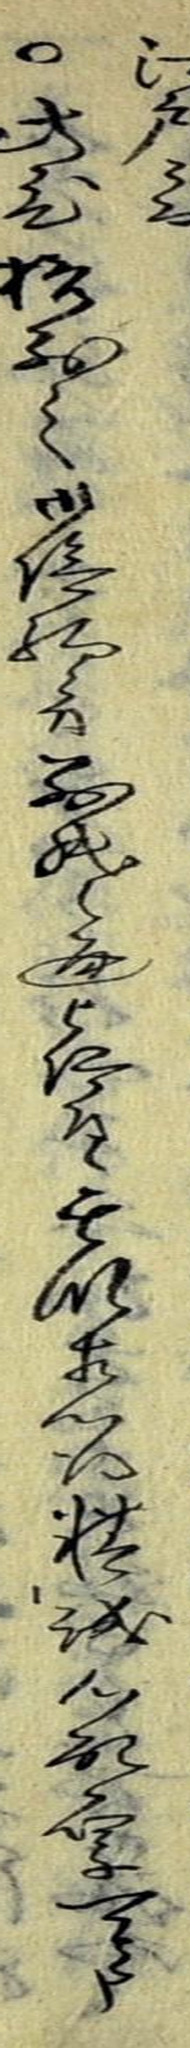○此度格別之御倹約ニ付別紙之通被仰付候其段相心得精誠心配厚可被申
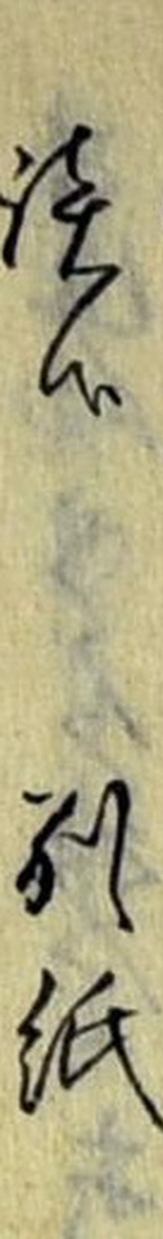談候別紙
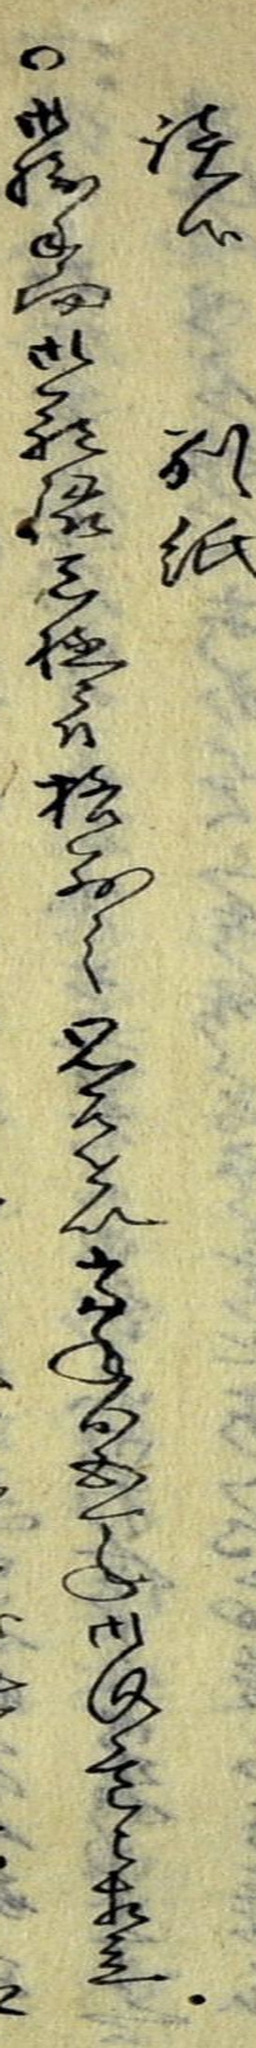○御勝手向御難渋至極ニ付格別之思召を以当年ゟ五ケ年御趣意被相立

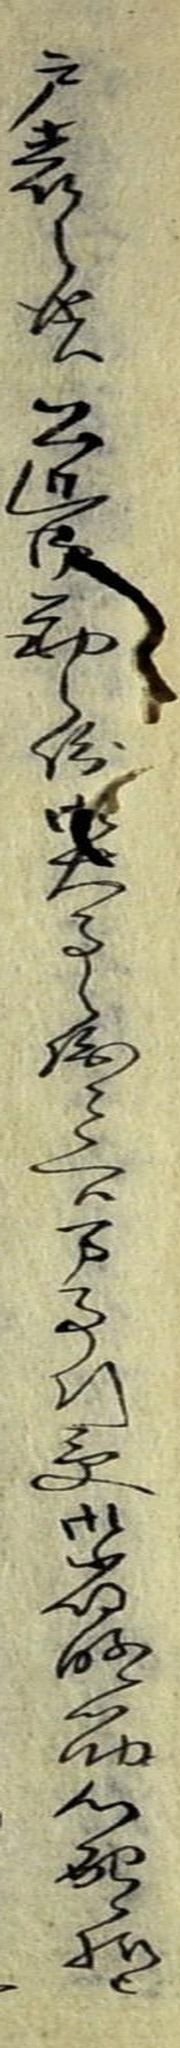戸表之儀ハ公辺御勤之儀御大事之儀ニ候へハ万事引受御省略筋心配候様被
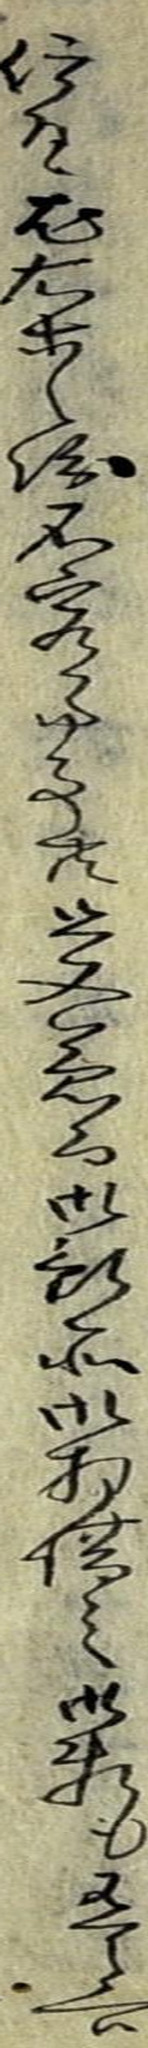仰付候尤右等之儀不容易事共且又兼而御預所御拝借之御頼も有之候へハ
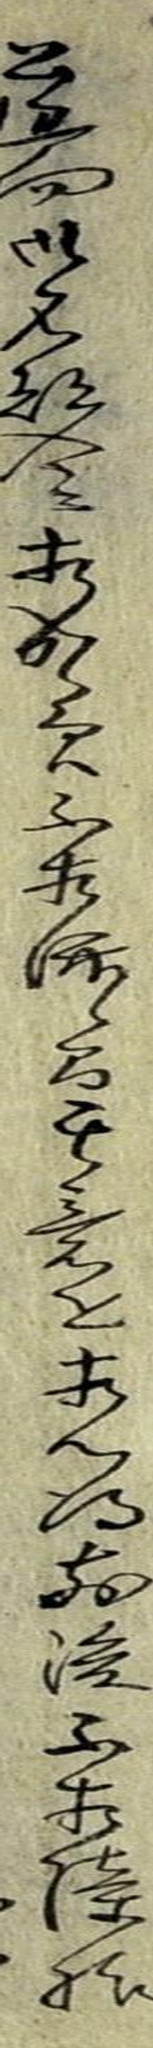公辺向御不都合ニ相成候而ハ不相済候間其意を相心得前後不相障様
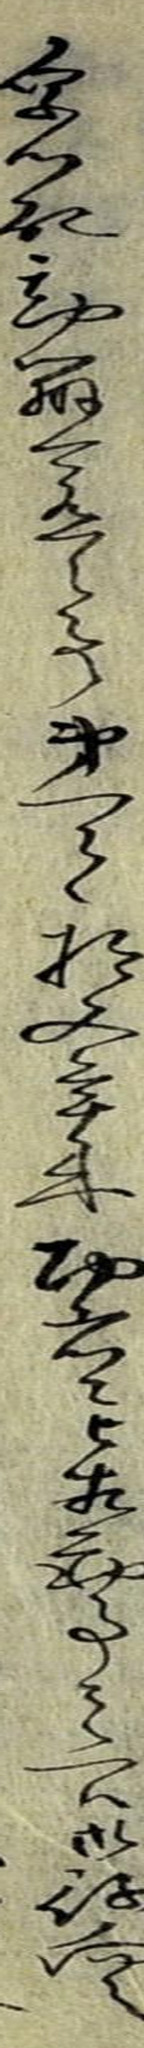厚心配勘弁可有之事第一ニ候将又年来功者ニ被相勤事ニ候へハ御役向之
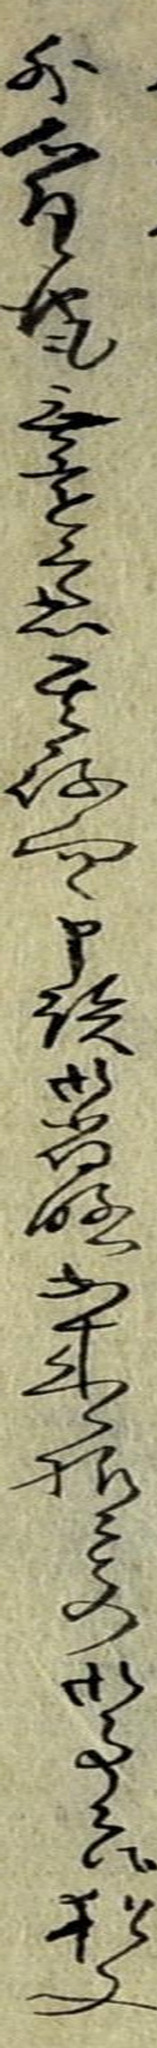外心付候儀も無遠慮其役向へ申談御省略出来候様ニとの御事ニ候猶又
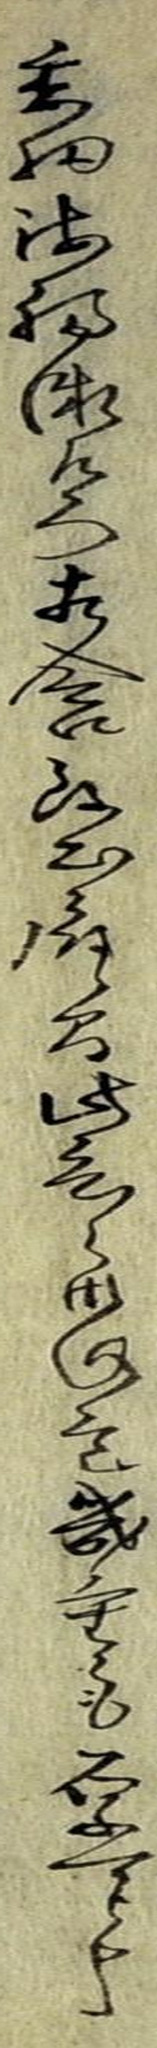委細海福瀬左衛門相含致出府候間此度之御趣意幾重ニも厚可被申
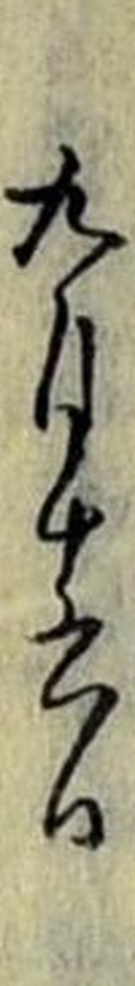九月十六日
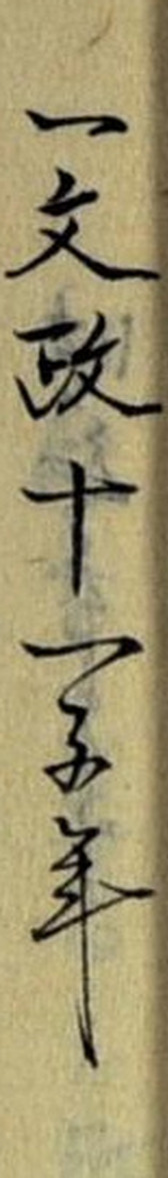一文政十一子年
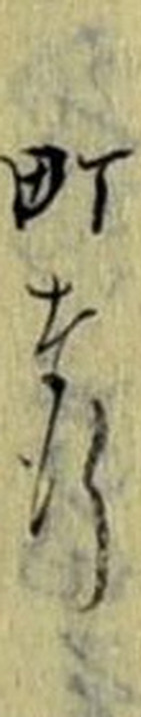町奉行
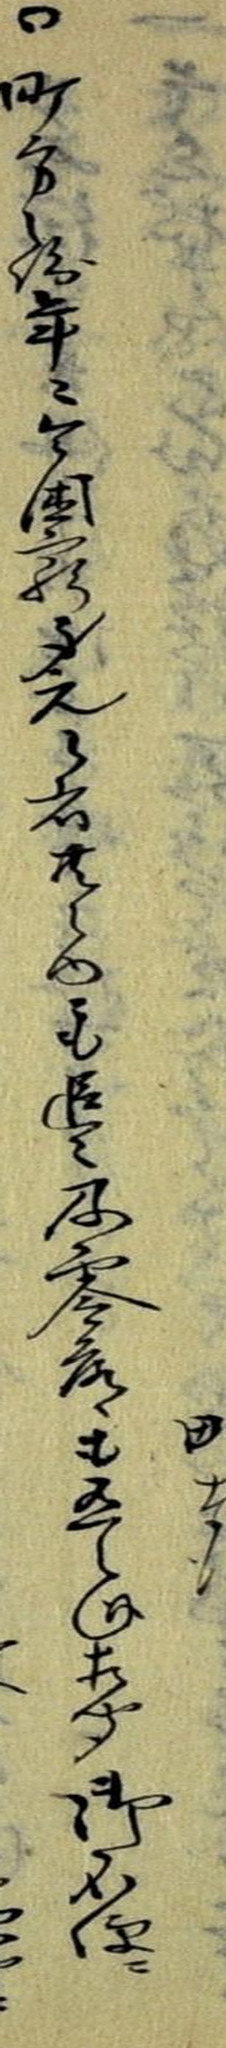○町方之儀年々令困窮身元之者共之内ニも追々及零落候も有之趣相聞御不便ニ
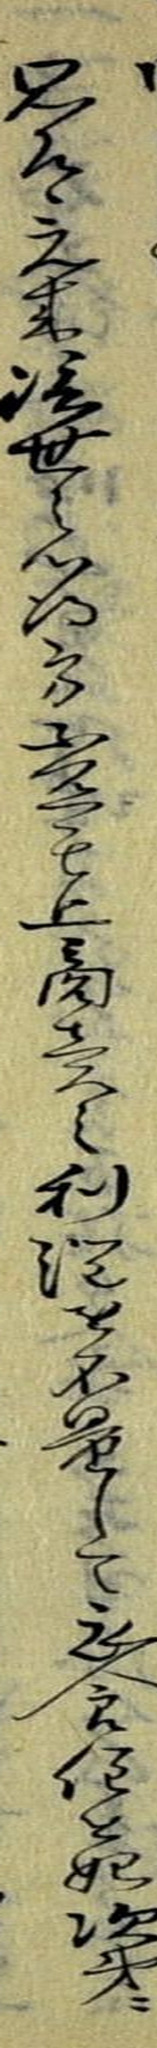思召候元来渡世之心得方不宜其上商売之利潤を不量して衣食住を始次第ニ
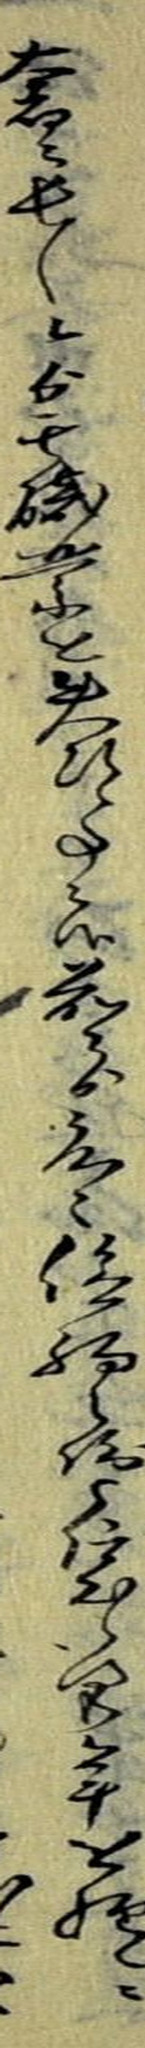奢ニ長し候ゟ其職業を失ひ候事ニ候前々ゟ度々倹約之儀被仰出候得共年を経候ニ
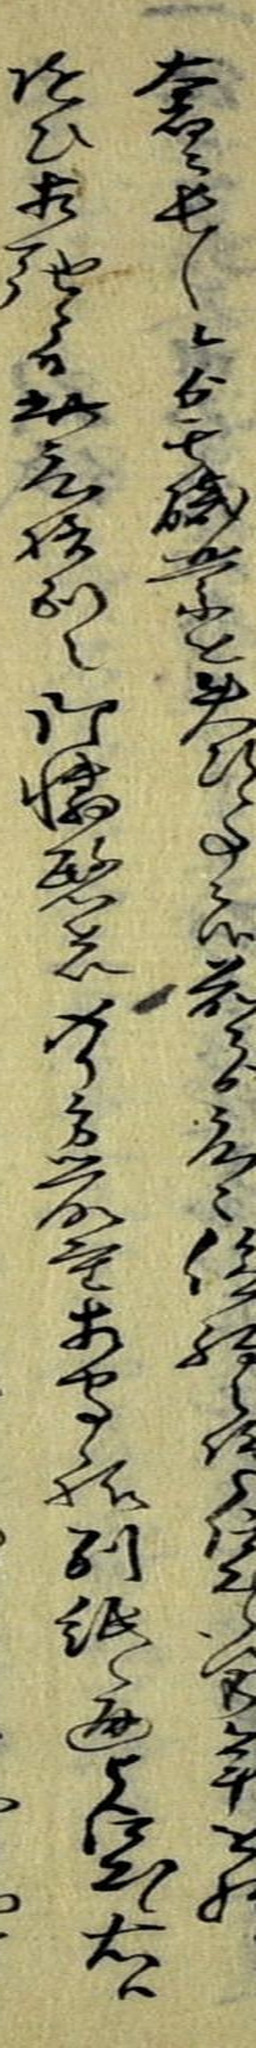随ひ相弛候ニ付此度格別之御憐愍を以〆り方厳重相守候様別紙之通被仰出候右ハ
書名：命令之部 五
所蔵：福井県文書館 Fukui Prefectural Archives
